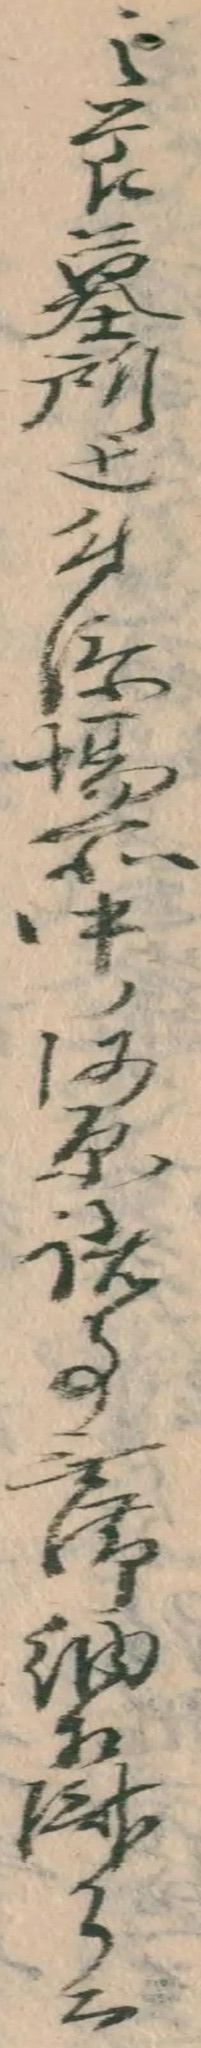之節墓所迄付添場所中ノ河原諸事無滞納相済了而
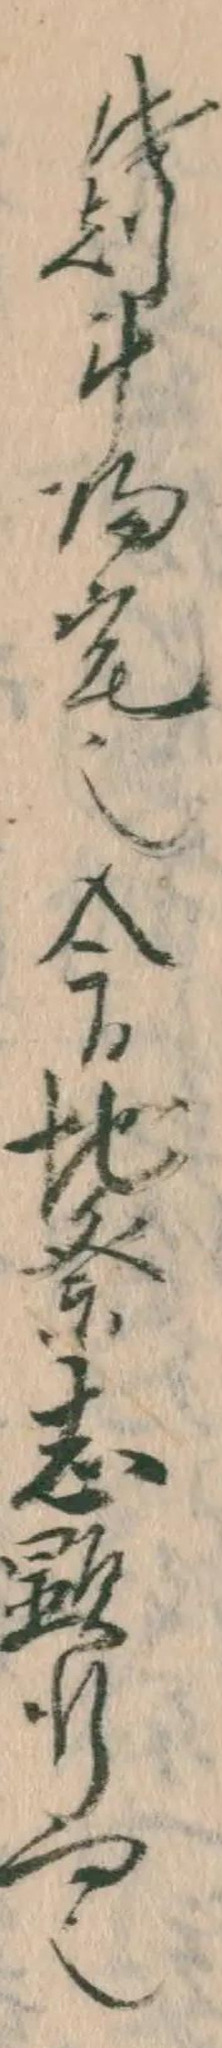戌刻斗帰宅也今日地祭志顕行向也
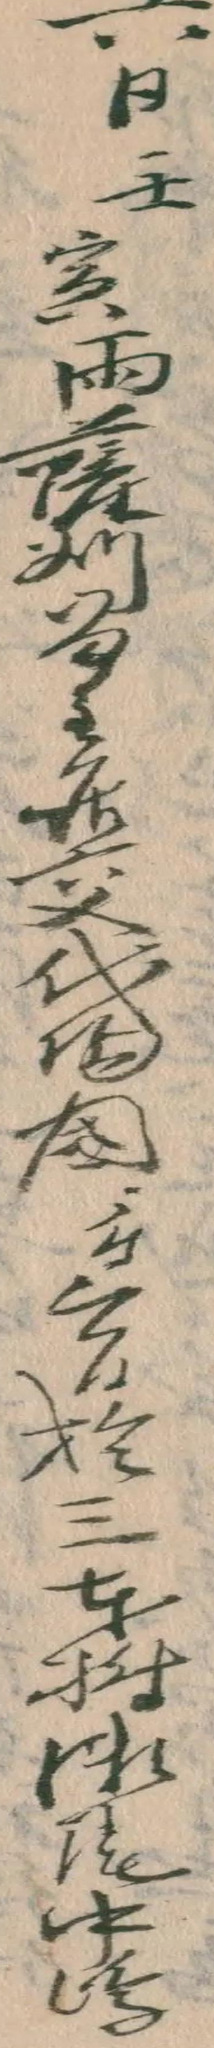六日壬寅雨薩州留主居交代帰國ニ付今日於三本村瀬尾中嶋
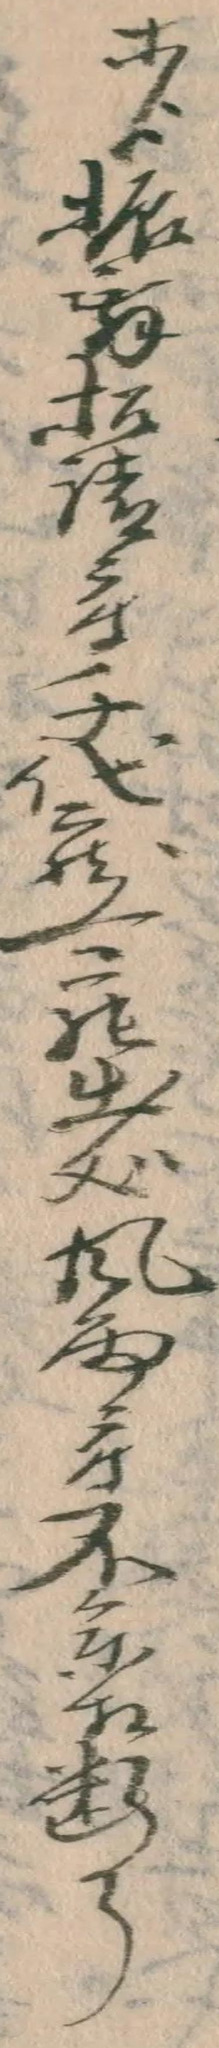等ゟ振舞招請ニ付千代蔵一罷出処風雨ニ付不参相断了
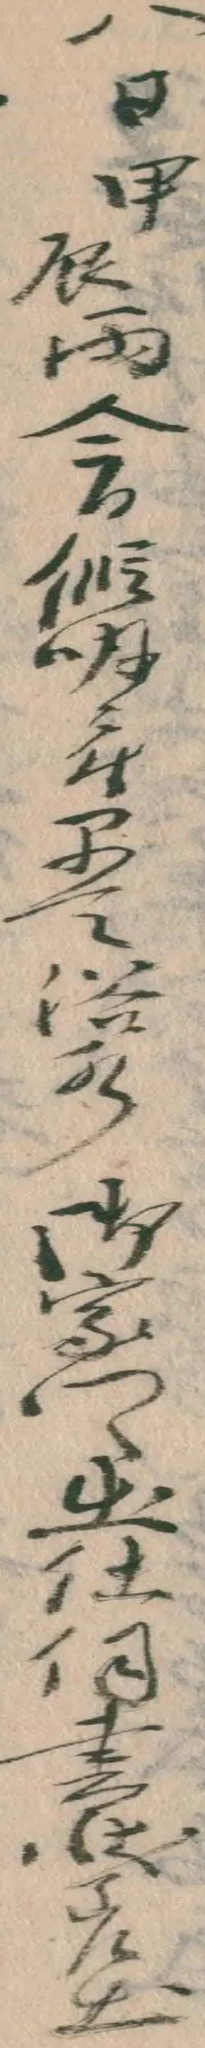八日甲辰雨今日仮明ニ付早々浴水御家門へ出仕伺書状差出
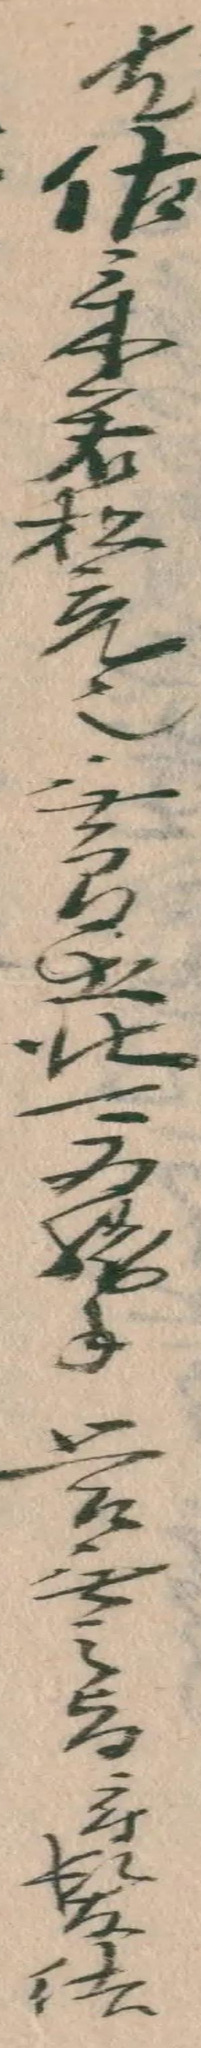尤佐々来若松充也無間出仕可為勝手思候無之旨ニ付整諸
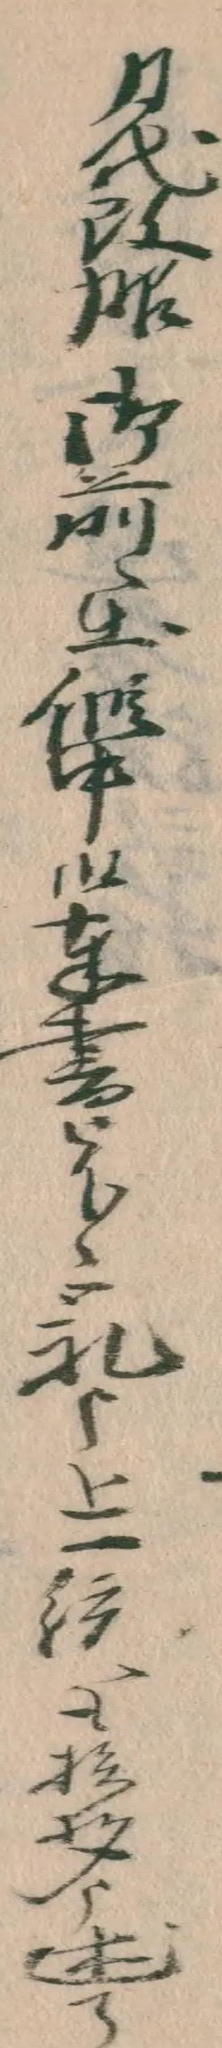月代改様御前へ出仮中御奉書被下候御礼申上一統へも挨拶述了
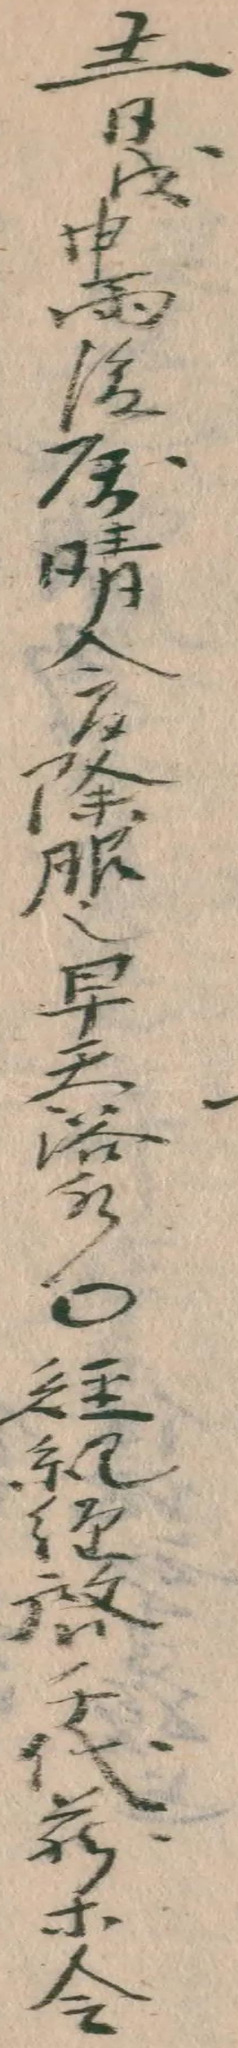十二日戊申雨後属晴今日除服也早天浴水○経紀経啓千代蔵等令
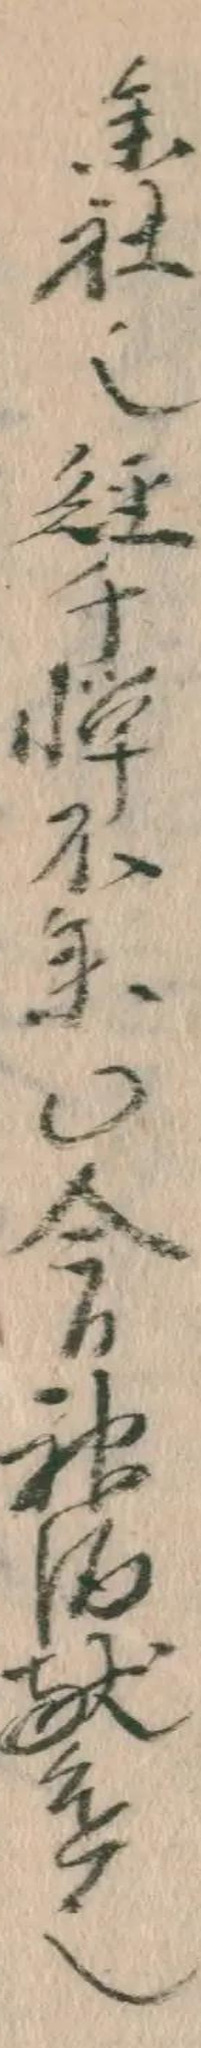参社也経千憚不参○今日神酒献進也
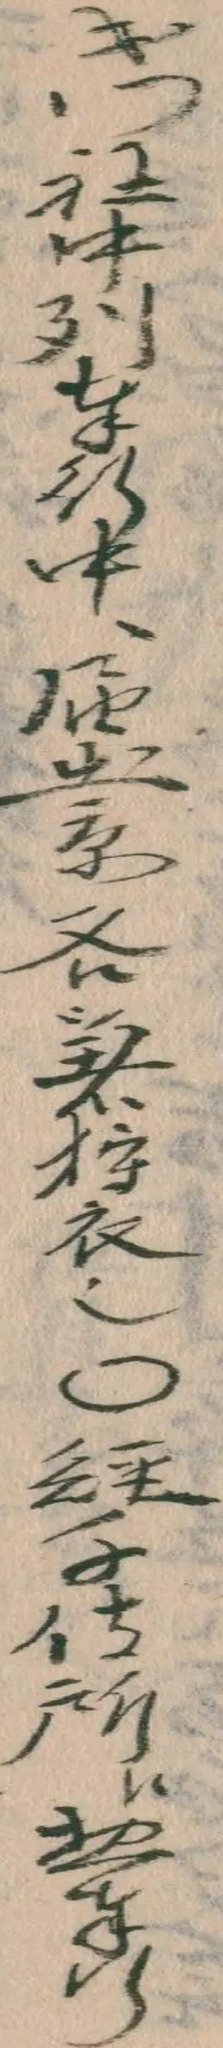出門社中列奉行中ヘ届出京各着狩衣也○経千侍所江惣奉行
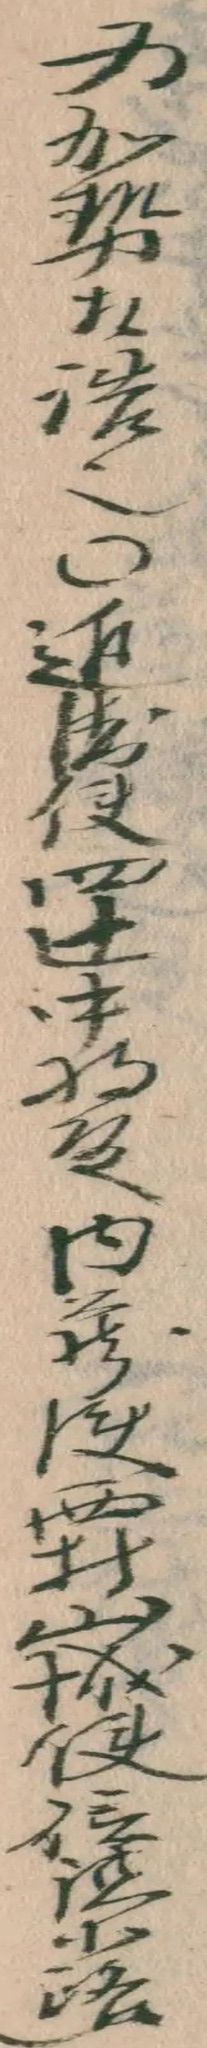為加勢相詰也○近衛使四辻中将殿内蔵様西村山城使信徳小路也
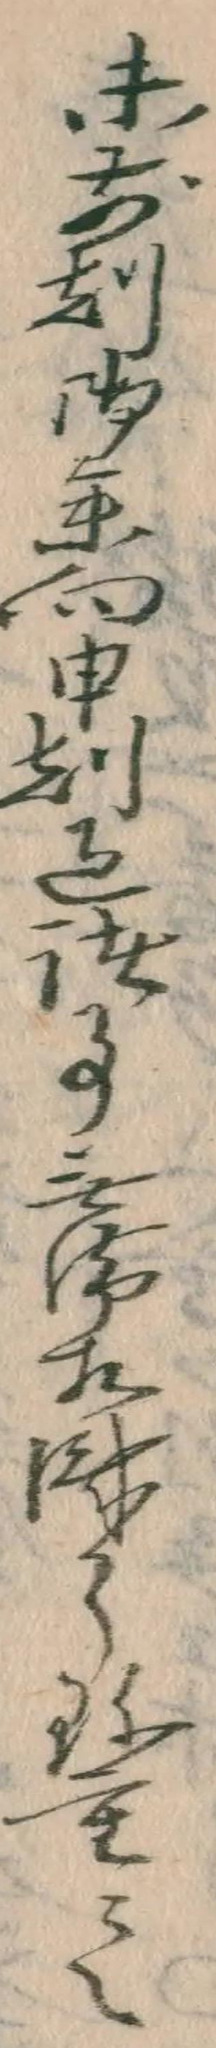未前刻御参向申刻過諸事無滞相済了珍重々々
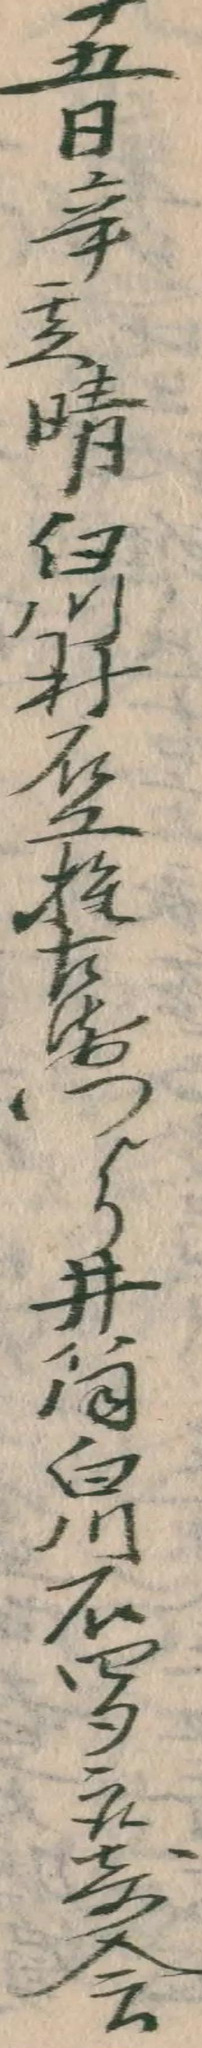十五日辛亥晴白川村石工権左衛門より井筒白川石四勺取寄今日
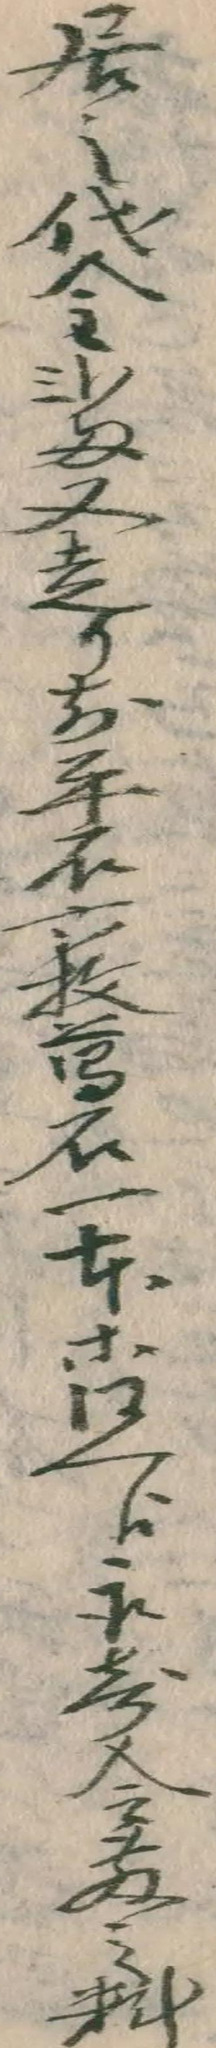居之代金弐両又走り前平石六枚尊石一本等同人ゟ取寄令之料
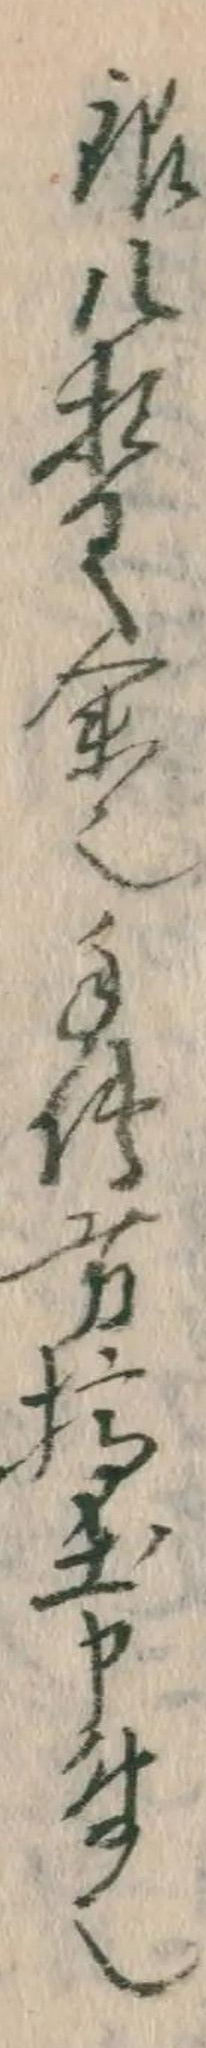銀八拾匁余也手傳方持玉申付也
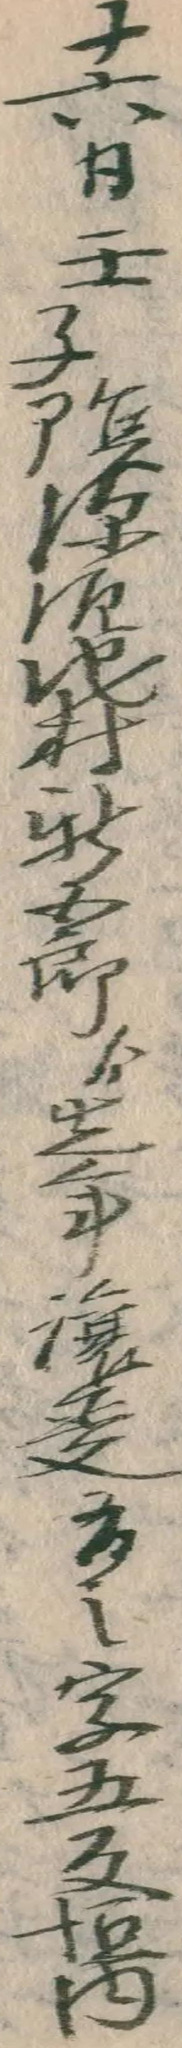十六日壬寅陰深泥池村新五郎ゟ先年譲受有之字五反垣内
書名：賀茂社記録. 第69冊
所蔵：国立国会図書館 National Diet Library, JAPAN
